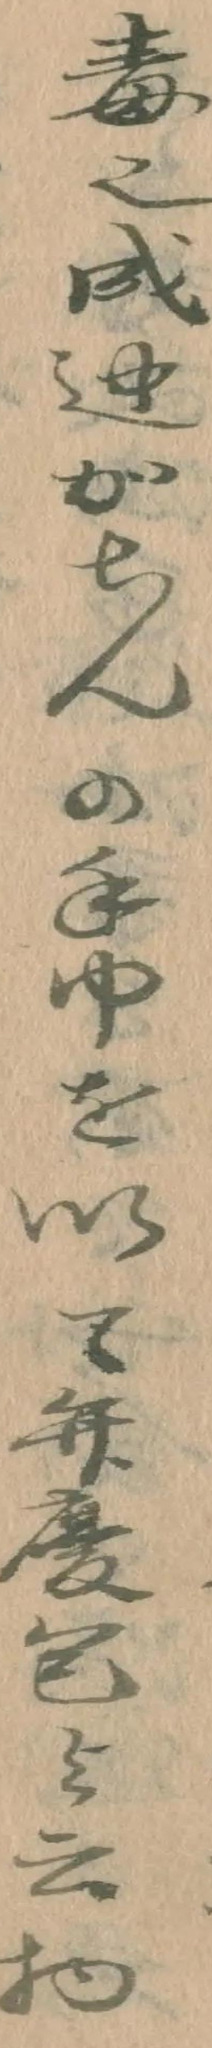毒也成迚かちんの手巾を以て弁慶包与云物
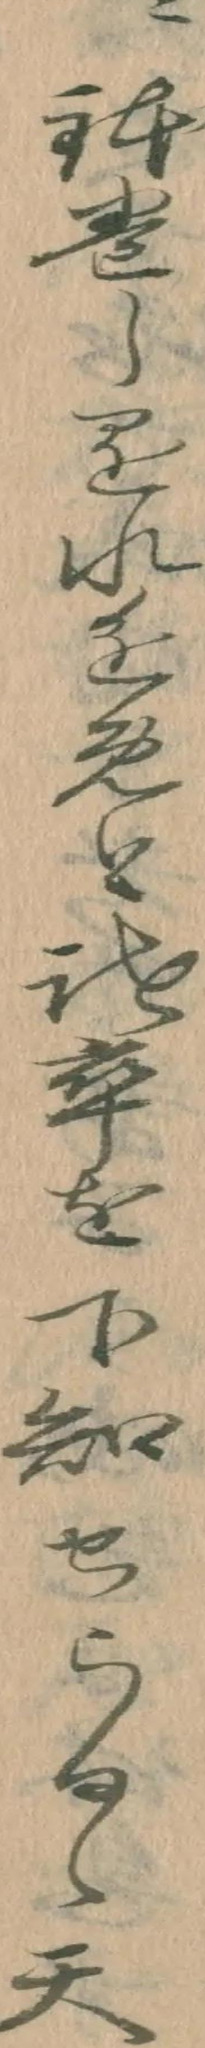に躰巻し懸れ進免と諸卒を下知せらるゝ天
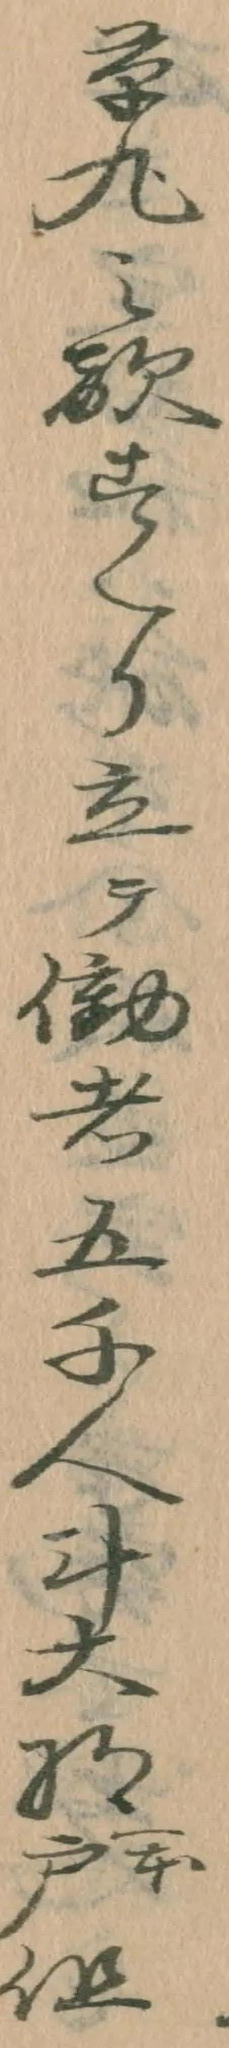草丸之敵春くり立て働者五千人斗大将戸但
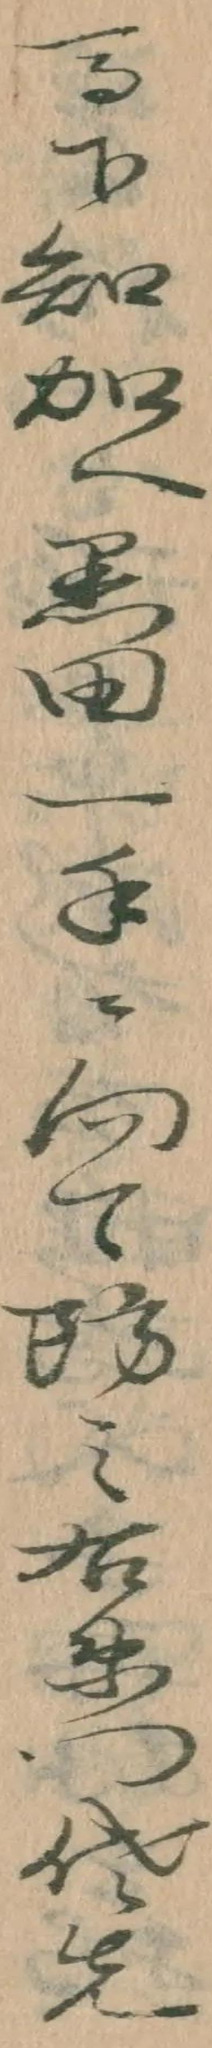馬下知加へ黒田一手に向て防之右衛門佐先
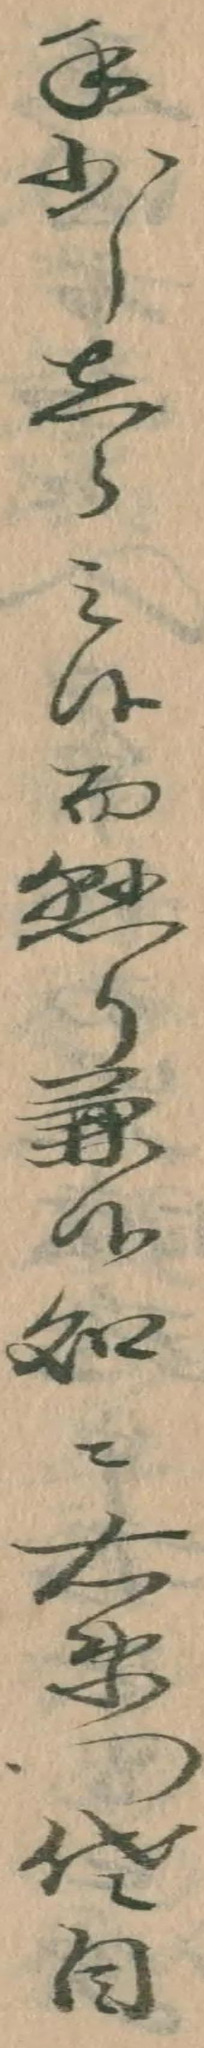手少し志らみ候而懸り兼候処に右衛門佐自
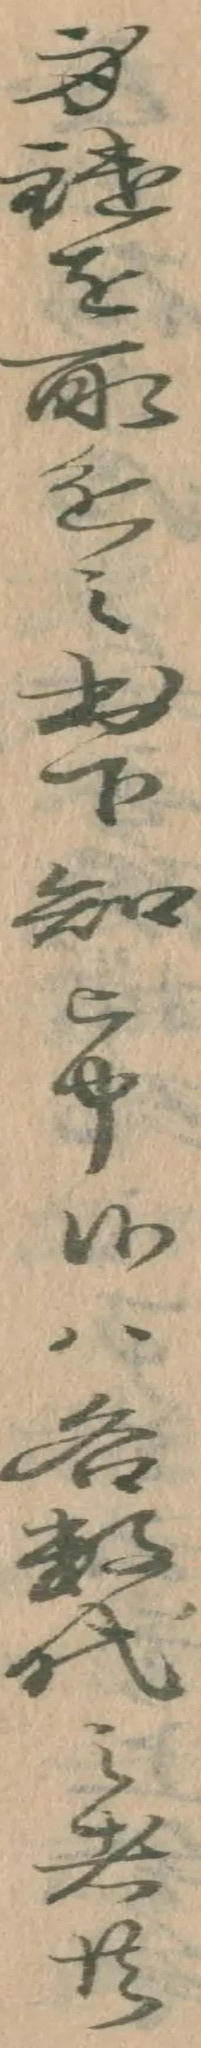身鑓を取進之出下知被申候は各数代之者共
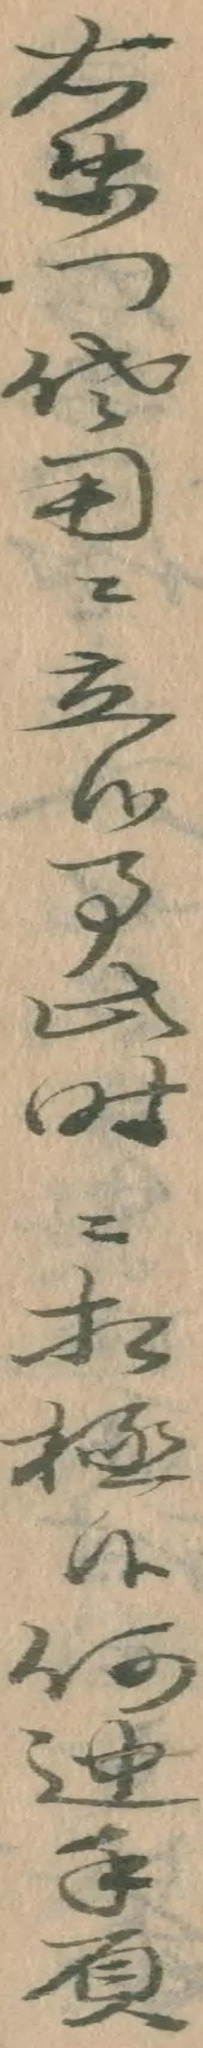右衛門佐用に立候事此時に相極候何迚手負
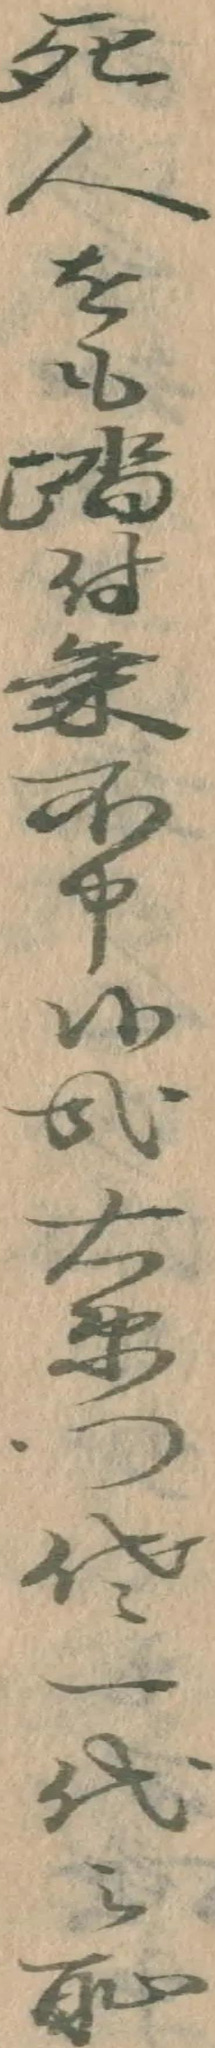死人をも踏付乗不申候哉右衛門佐一代之恥
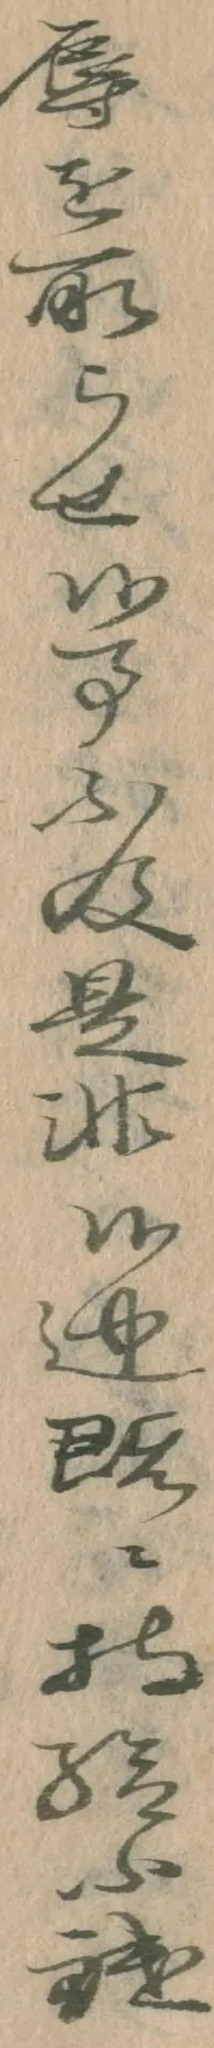辱を取らせ候事ふ及是非候迚既に持給ふ鑓
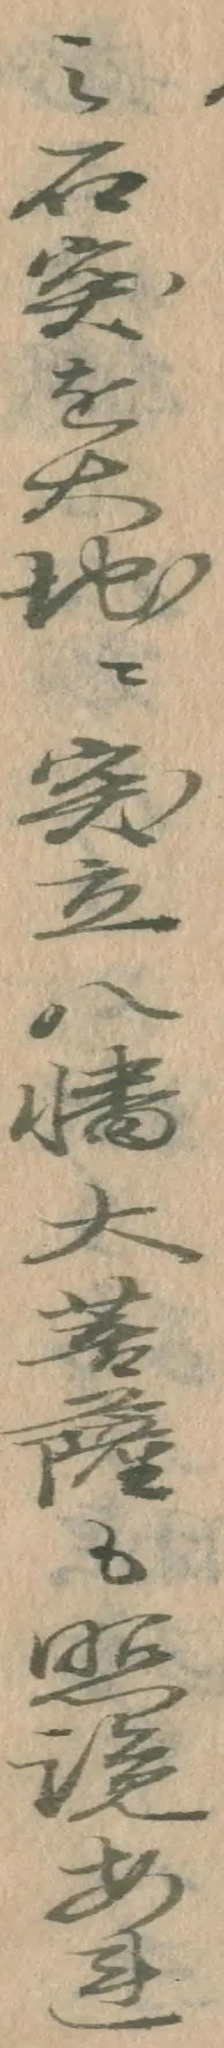之石突を大地に突立八幡大菩薩も照覧あ連
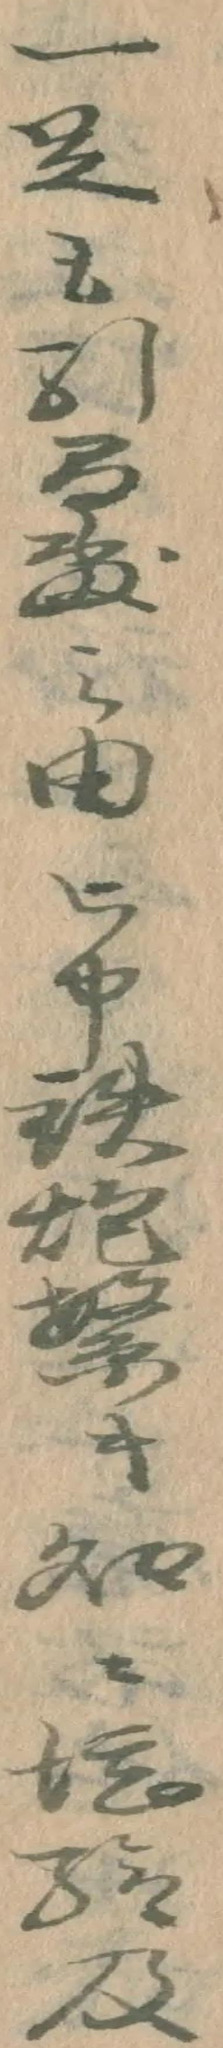一足も引間敷之由被申鉄炮繁き処に堪給及
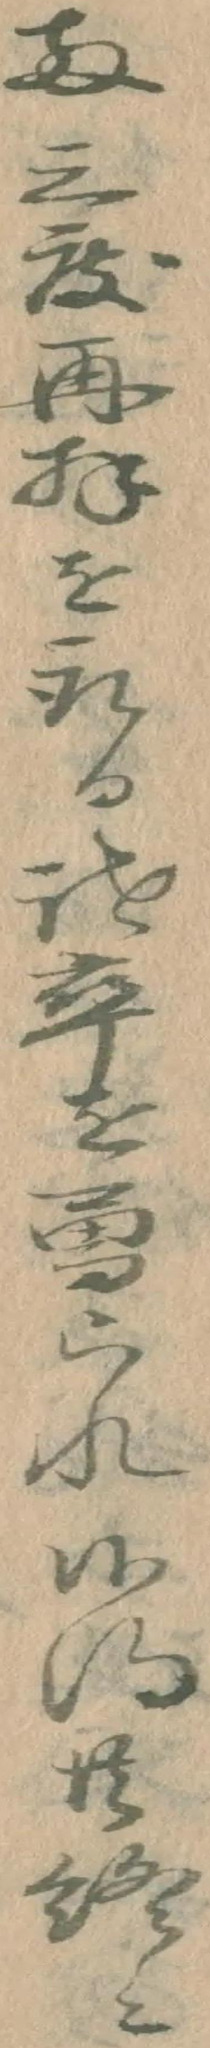両三度再拝を取る諸卒を勇られ候得共終に
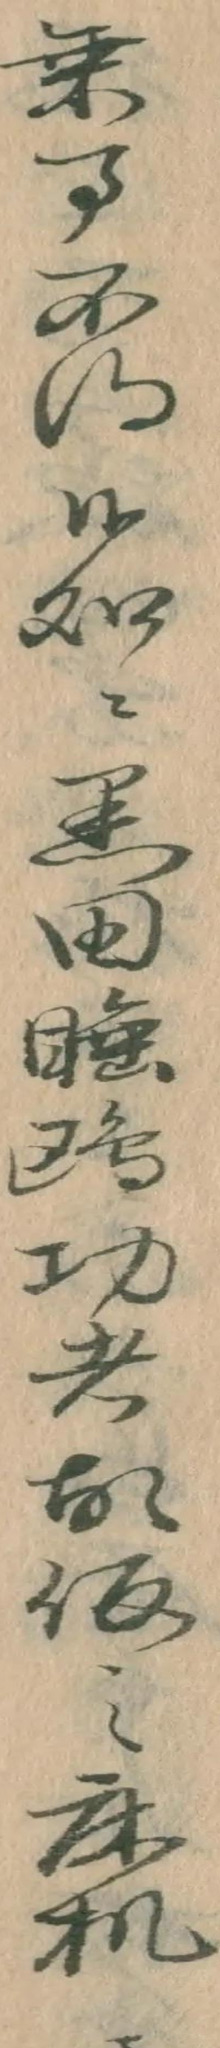乗事不得候処に黒田睡鴎功者故仮之床机に

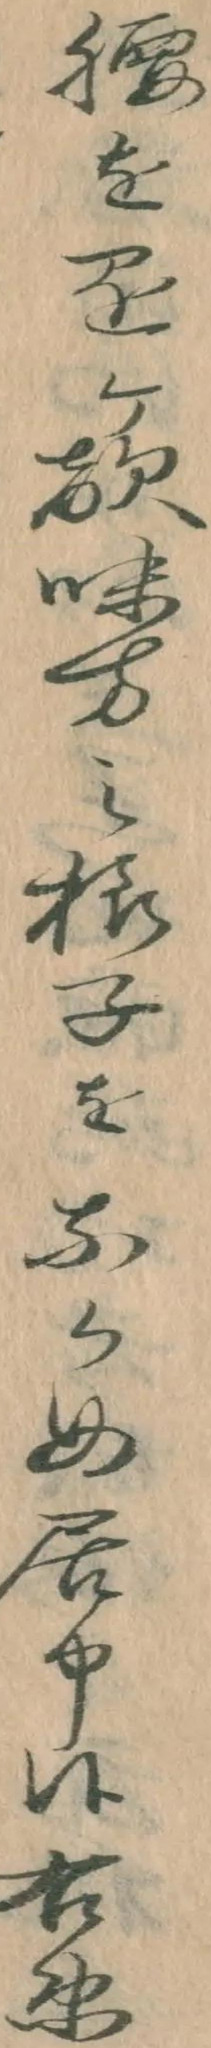腰を懸け敵味方之様子をなかめ居申候右衛
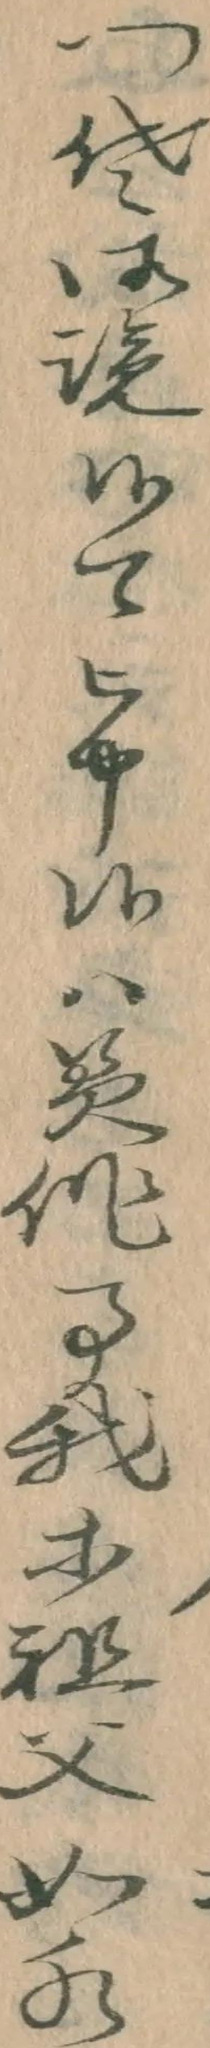門佐御覧候て被申候は美作事我等祖父如水
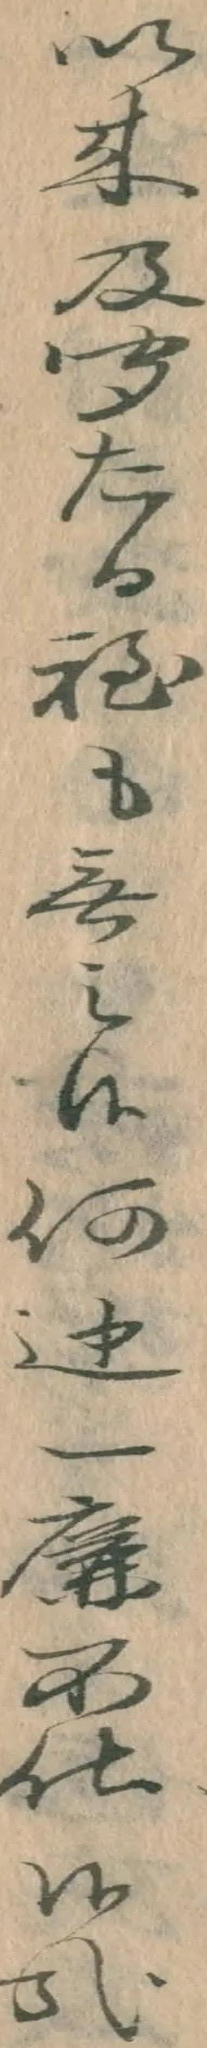以来及聞たる程も無之候何迚一廉不仕候哉
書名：切支丹御退治記 49巻. [7]
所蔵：国立国会図書館 National Diet Library, JAPAN
